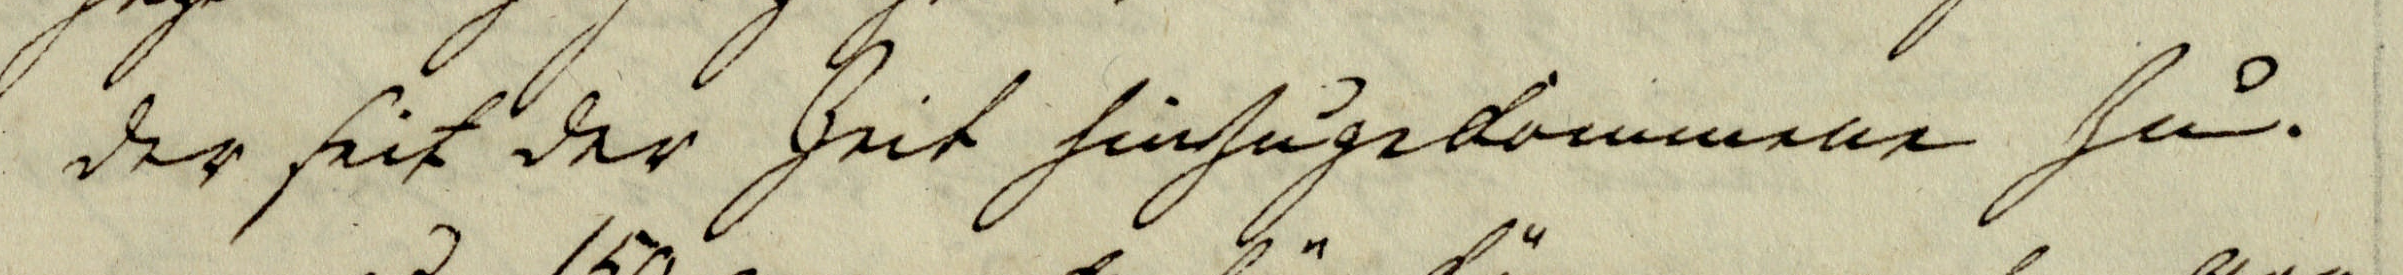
der seit der Zeit hinzugekommene Zu¬
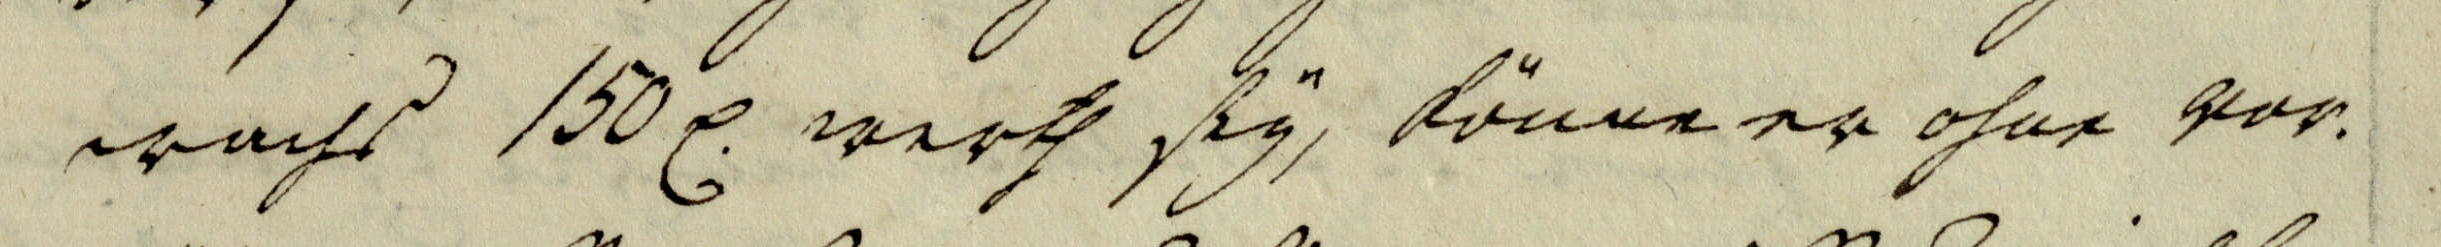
wachs 150 l. werth seÿ, könne er ohne vor¬
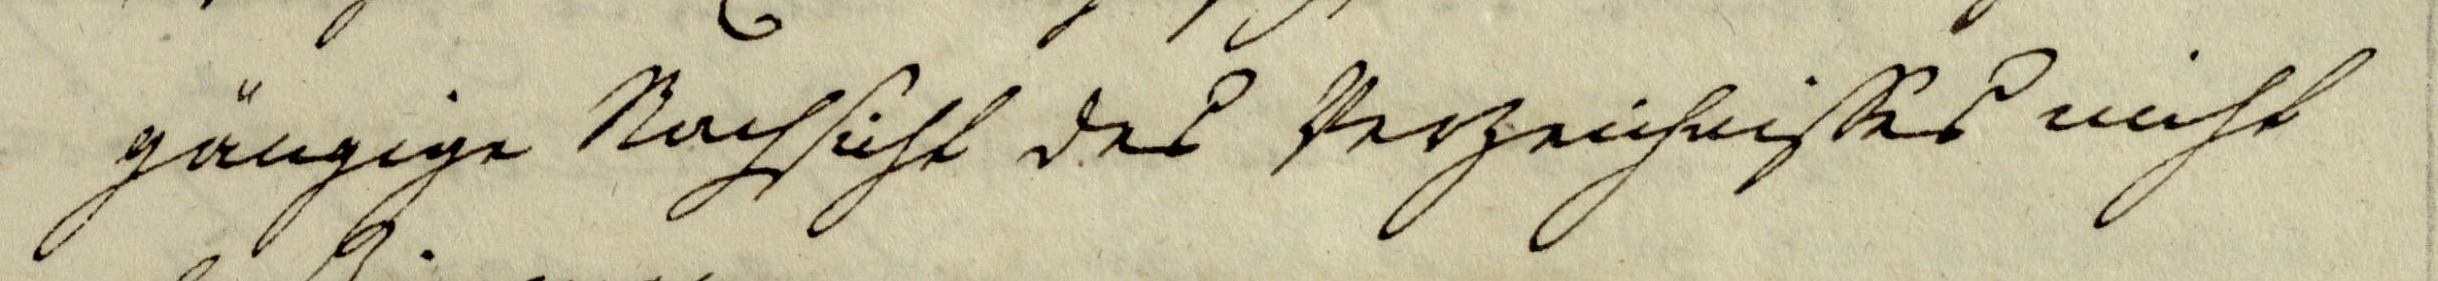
gängige Nachsicht des Verzeichnisses nicht
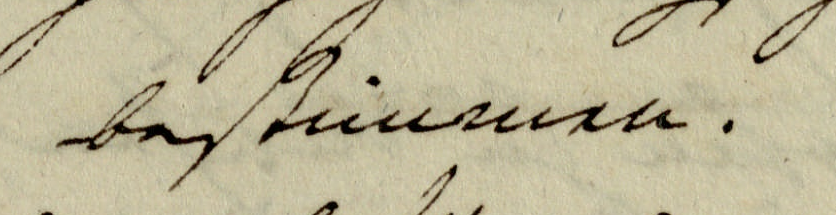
bestimmen.
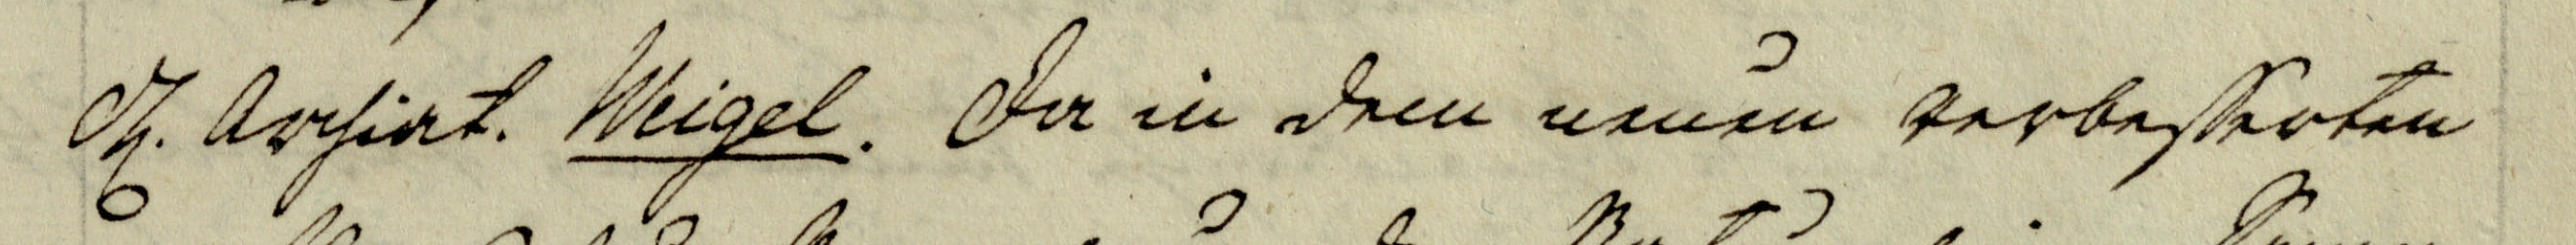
dh. Archiat. Weigel. Da in dem neuen verbesserten
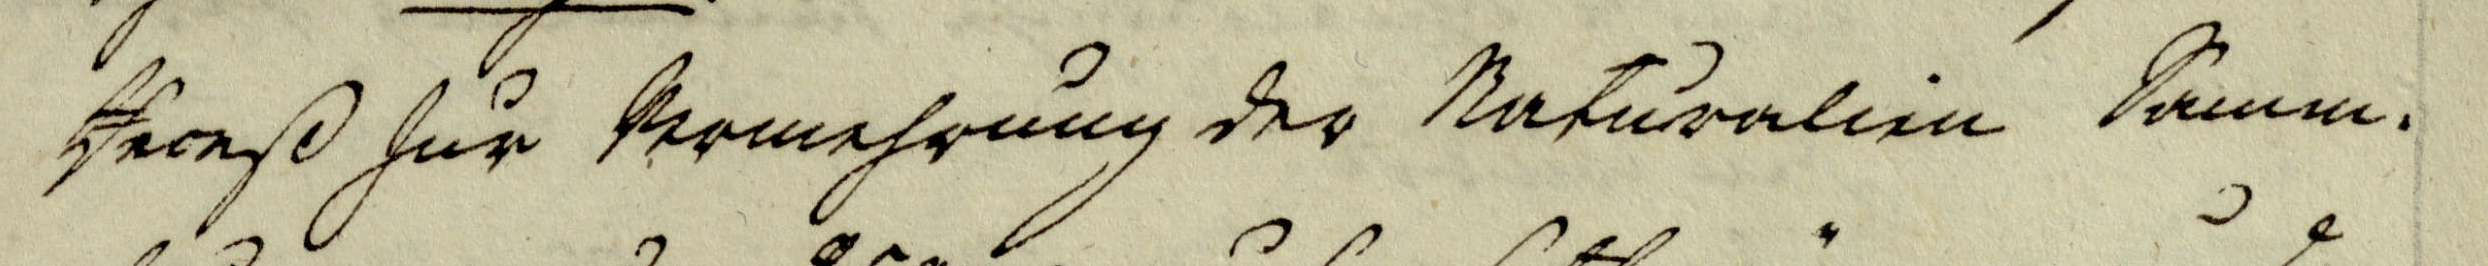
Receß zur Vermehrung der Naturalien Samm¬
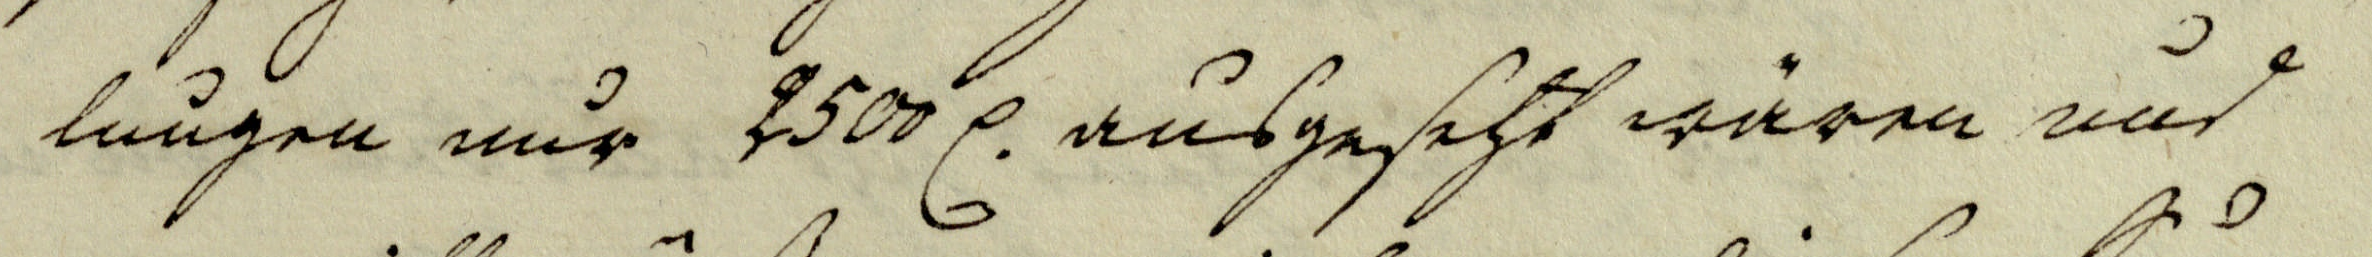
lungen nur 2500 l. ausgesetzt wären und
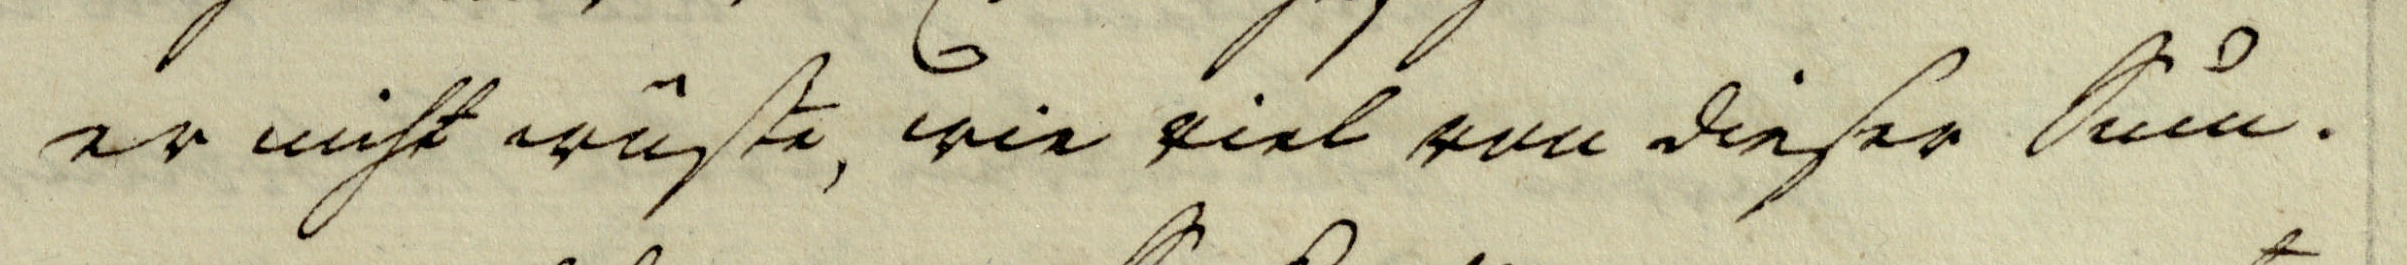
er nicht wüßte, wie viel von dieser Sum¬
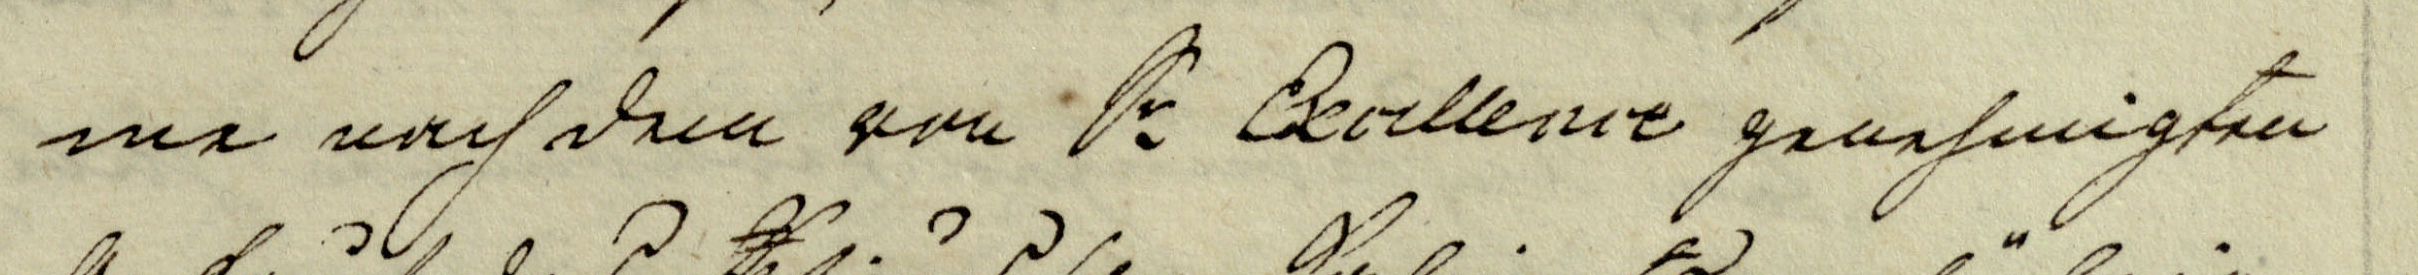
me nach dem von Sr Excellence genehmigten
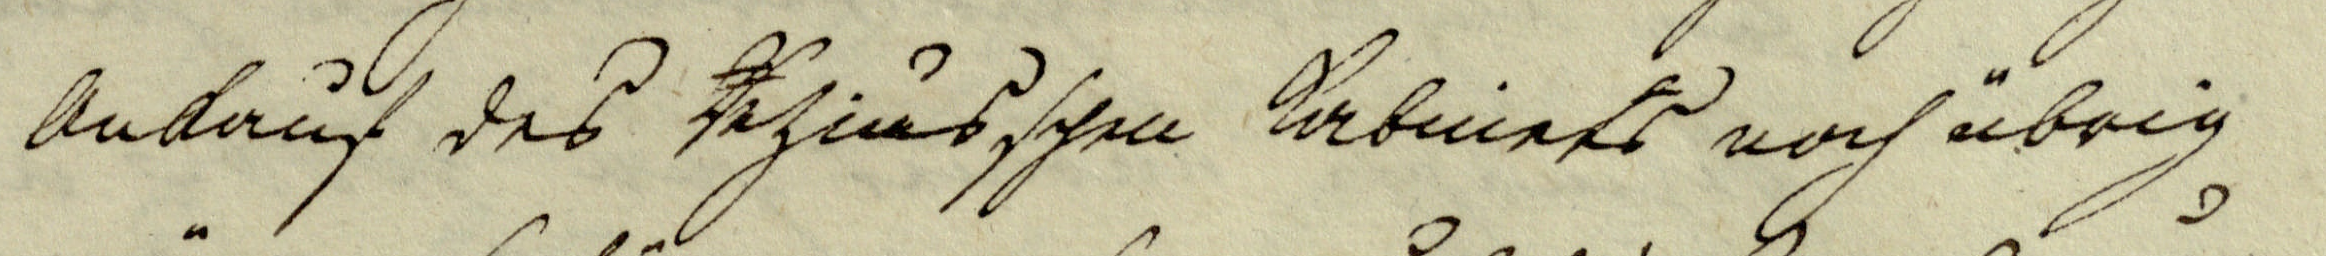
Ankauf des Reziusschen Kabinets noch übrig
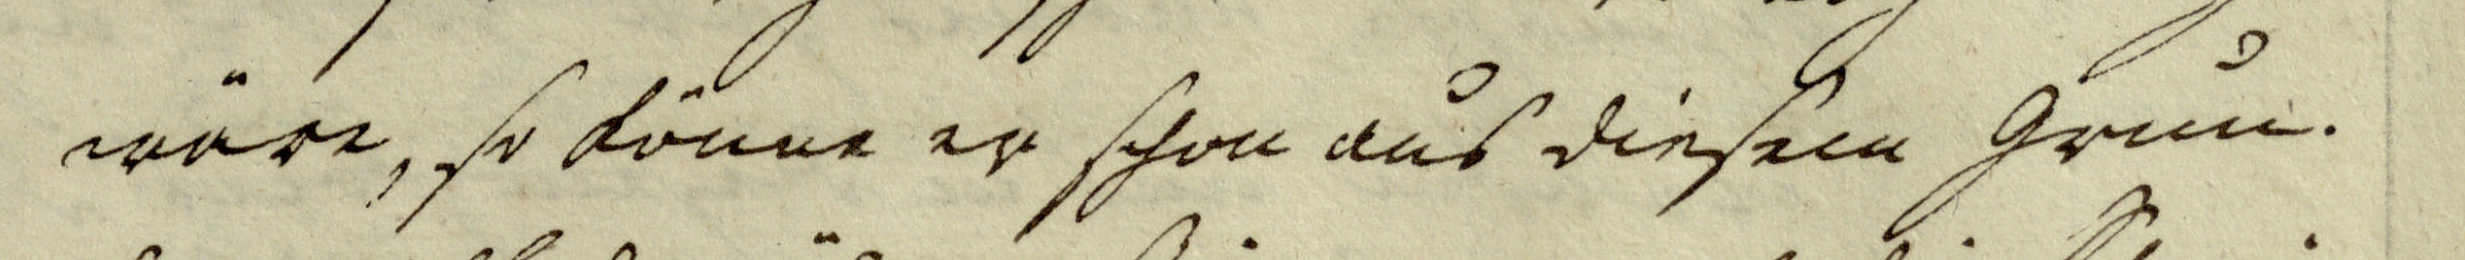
wäre, so könne er schon aus diesem Grun¬
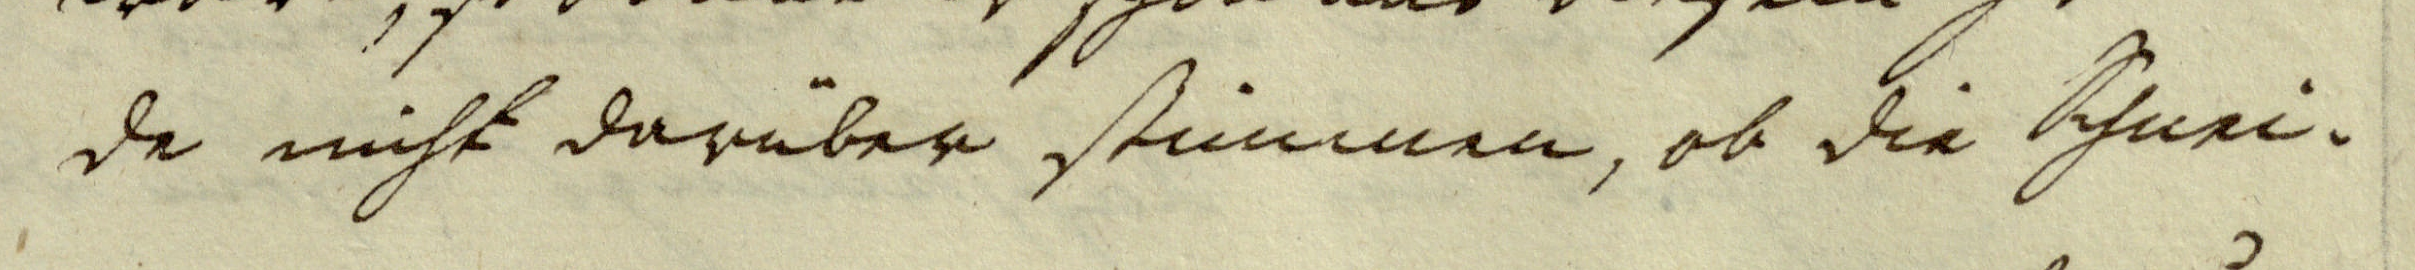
de nicht darüber stimmen, ob die Schnei¬
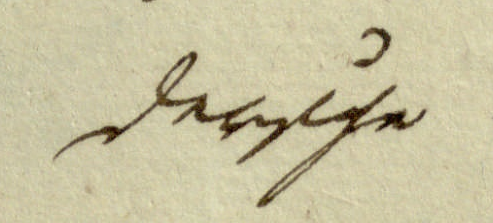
dersche
